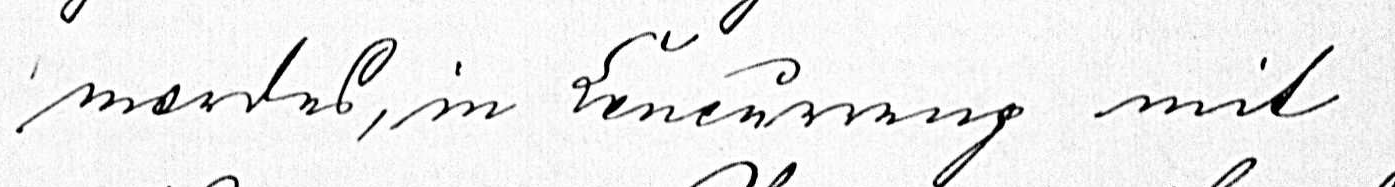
mendes, in Concurrenz mit
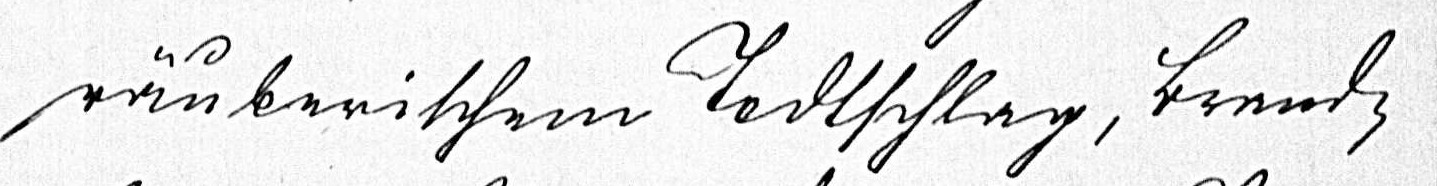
räuberischen Todtschlag, Brand¬
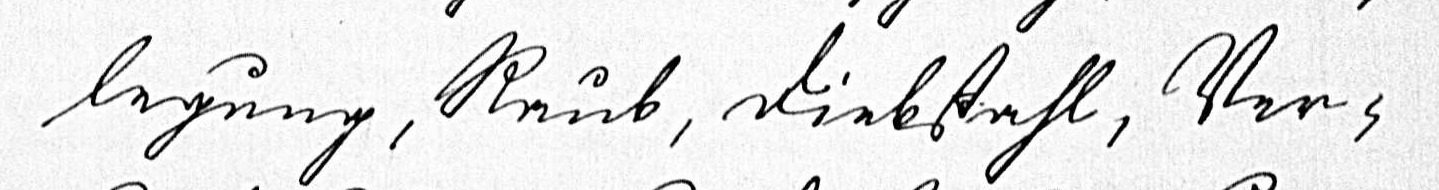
legung, Raub, Diebstahl, Ver¬
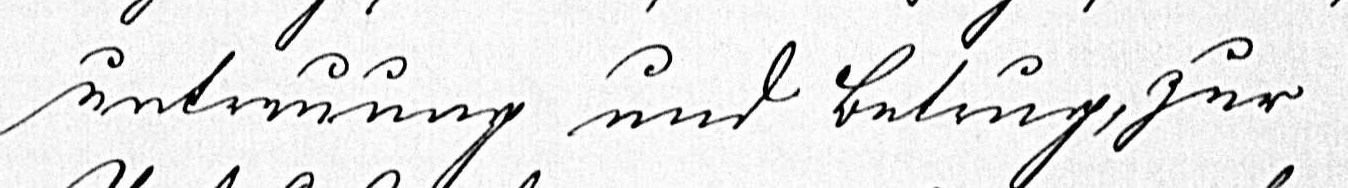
untreuung und Betrug, zur
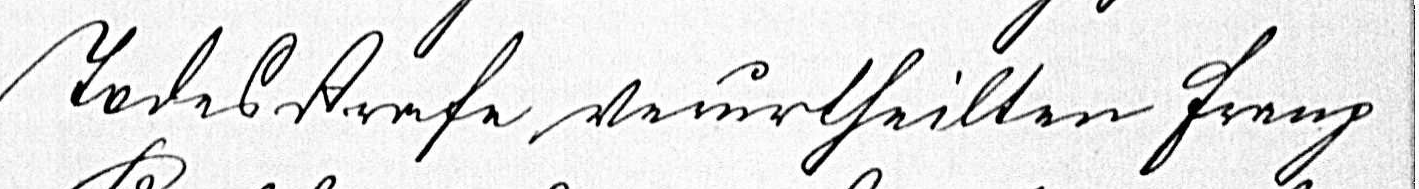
Todesstrafe verurtheilten Franz
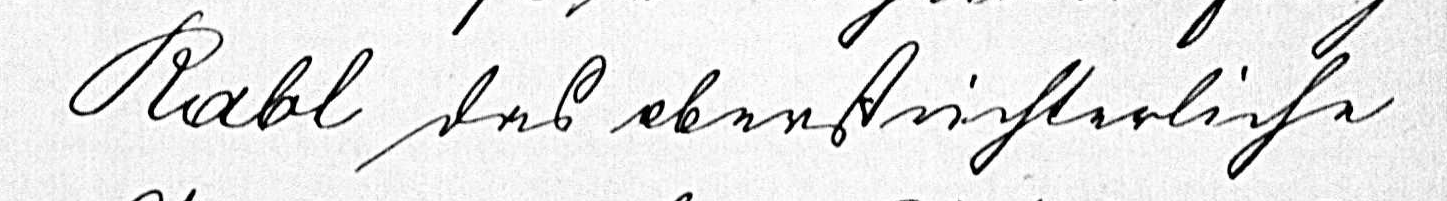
Rabl das oberstrichterliche
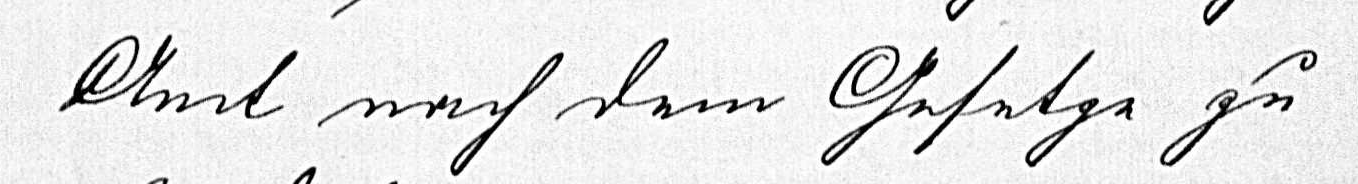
Amt nach dem Gesetze zu
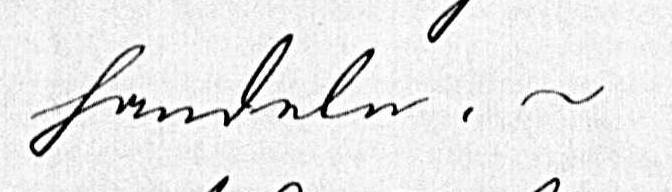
handeln.~
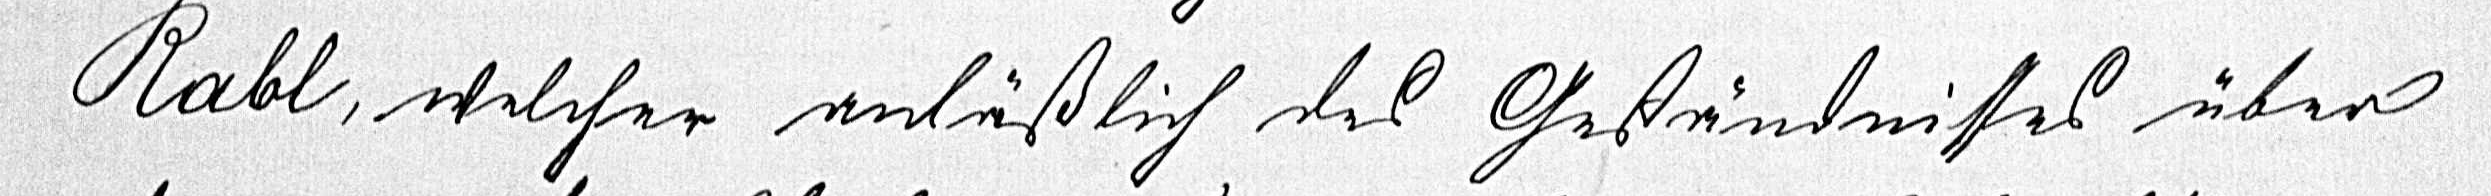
Rabl, welcher anläßlich des Geständnisses über
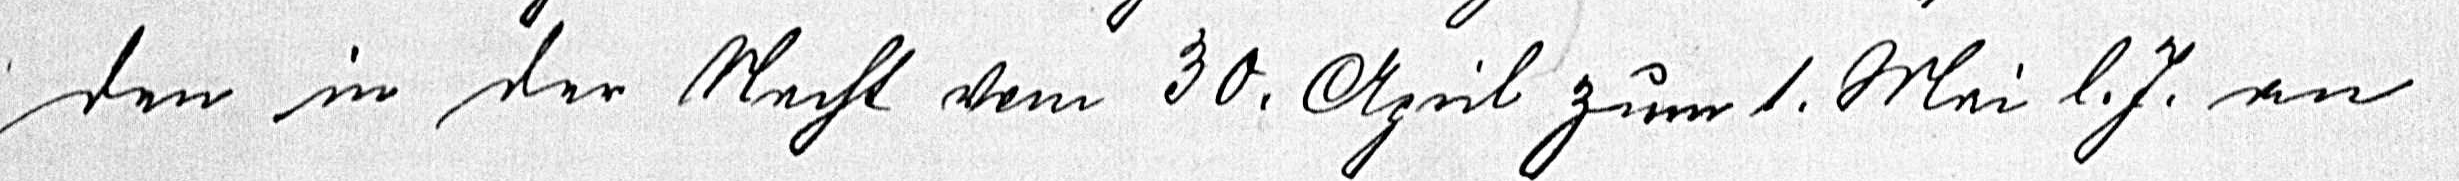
den in der Nacht vom 30. April zum 1. Mai l.J. an
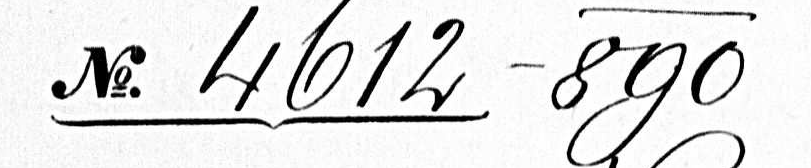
No. 4612 - 890
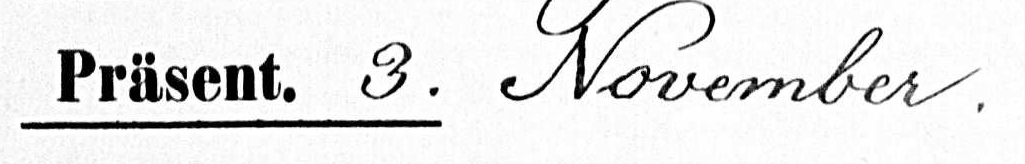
Präsent. 3. November.
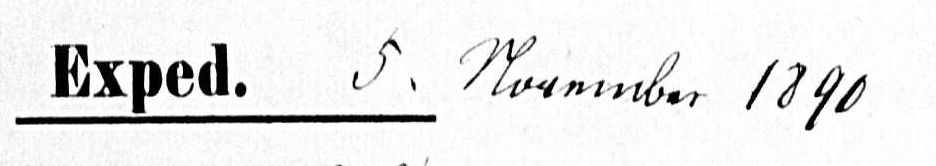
Exped. 5. November 1890
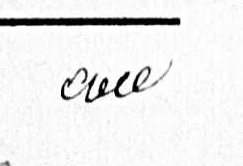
xx
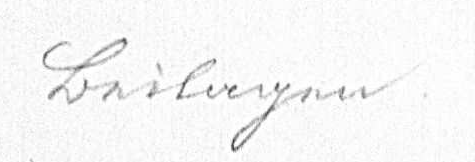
Beilagen
